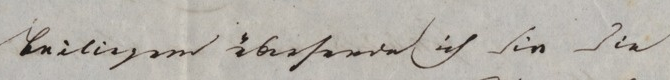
Beiliegend übersende ich Dir die
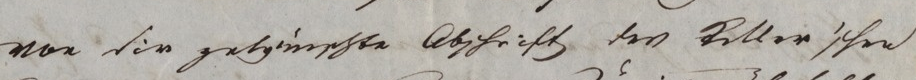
von Dir gewünschte Abschrift des Keller'schen
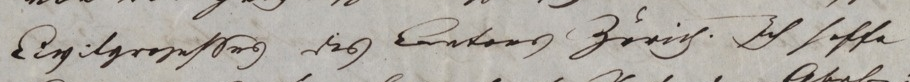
Civilprozesses des Cantons Zürich. Ich hoffe
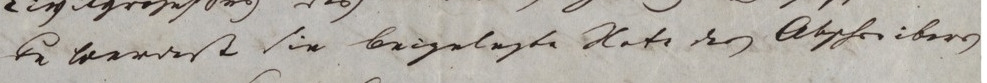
Du werdest die beigelegte Note des Abschreibers
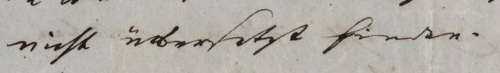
nicht übersetzt finden.
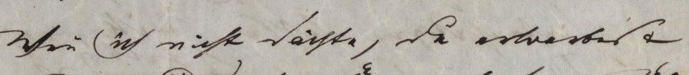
Wenn ich nicht dächte, Du erwartest
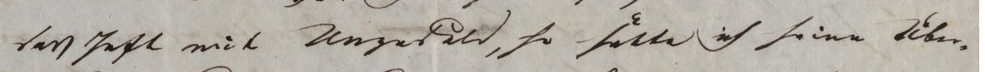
das Heft mit Ungeduld, so hätte ich seine Über-
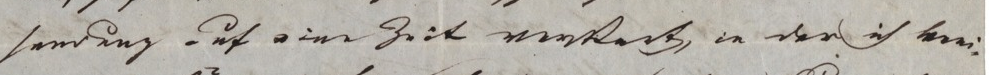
sendung auf eine Zeit verspart, in der ich weni-
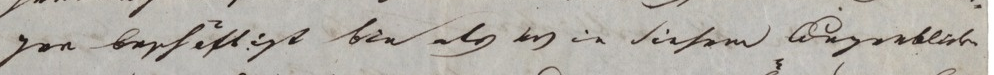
ger beschäftigt bin als es in diesem Augenblicke
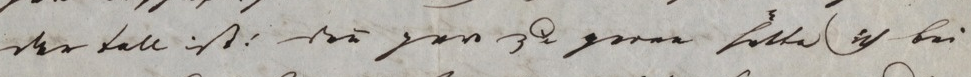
der Fall ist! Denn gar zu gerne hätte ich bei
